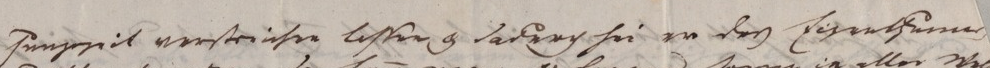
sungszeit verstreichen lassen & dadurch sei er des Eigenthumes
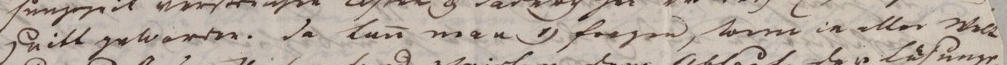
quitt geworden. Da kann man 1.) fragen, wem in aller Welt
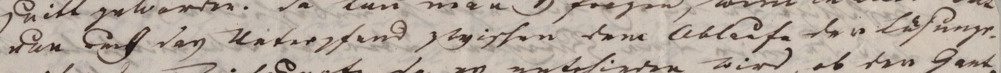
nun auch das Unterpfand zwischen dem Ablaufe der Lösungs-
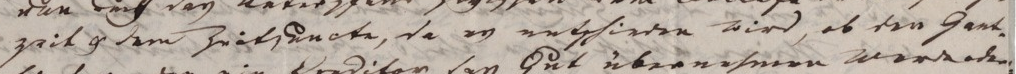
zeit & dem Zeitpuncte, da es entschieden wird, ob der Gant-
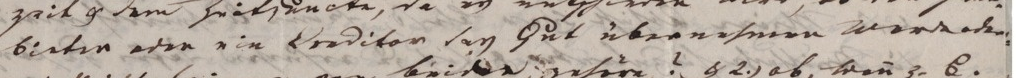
bieter oder ein Creditor das Gut übernehmen werde oder
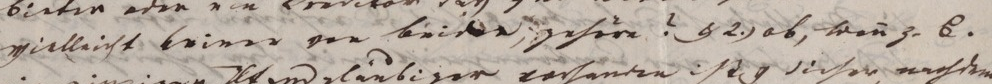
vielleicht keiner von Beiden, gehöre? & 2.) ob, wenn z. B.
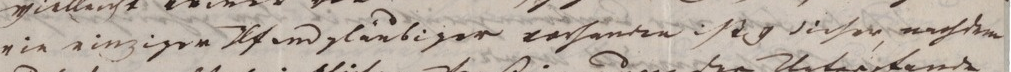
ein einziger Pfandgläubiger vorhanden ist & dieser, nach dem
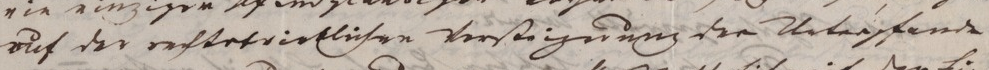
auf der rechtstrieblichen Versteigerung der Unterpfande
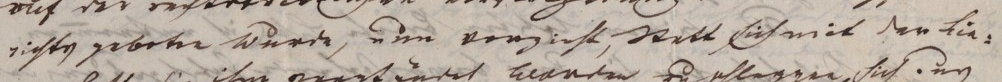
nichts geboten wurde, nun vorzieht, statt sich mit der Lie-
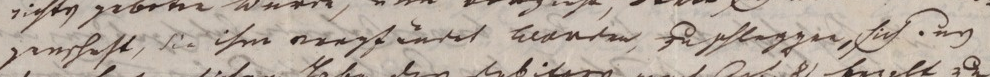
genschaft, die ihm verpfändet worden, zu schleppen, sich aus
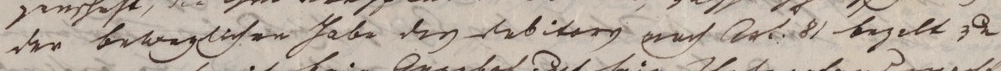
der beweglichen Habe des Debitors nach Art. 81 bezahltt zu
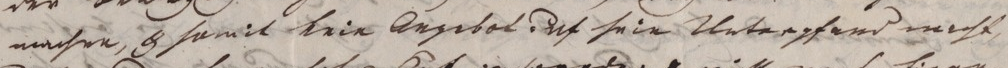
machen, u somit kein Angebot auf sein Unterpfand macht,
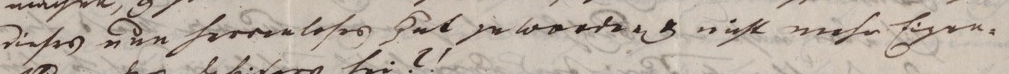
dieses nun herrenloses Gut geworden & nicht mehr Eigen-
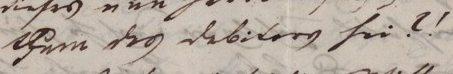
thum des Debitors sei?
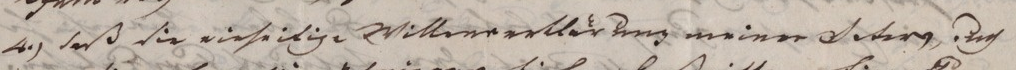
4.) Daß die einseitige Willenserklärung meines Vaters, auch
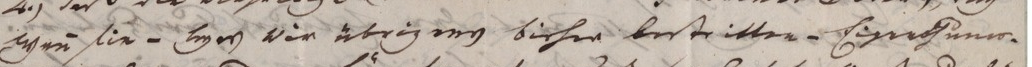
wenn sie – was wir übrigens bisher bestritten – Eigenthums-
